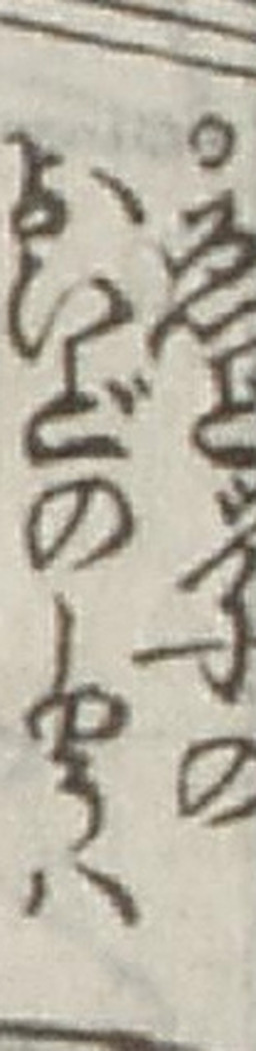おいどのしやうは
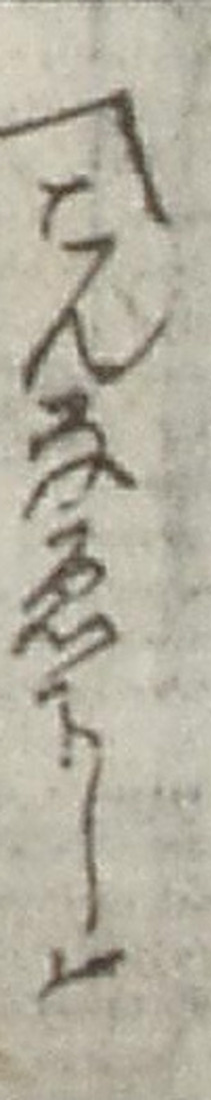〽こんなゑにし
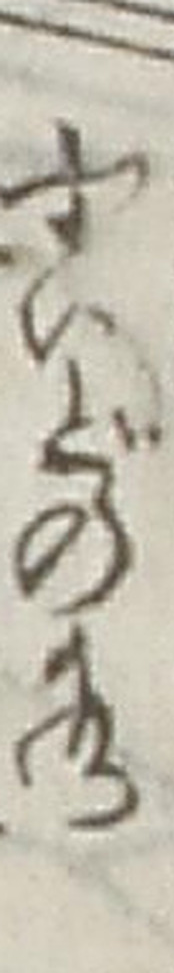おいどの水
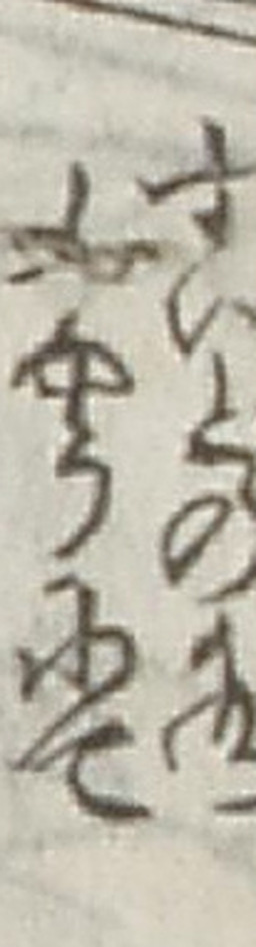しやうにて
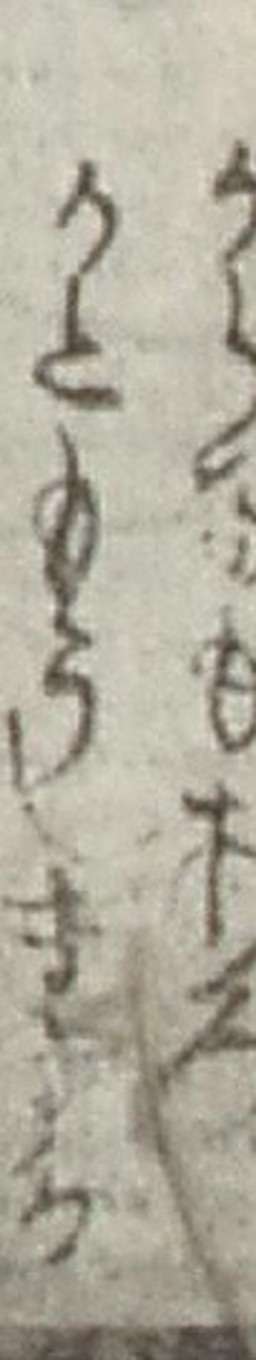かともうしまする
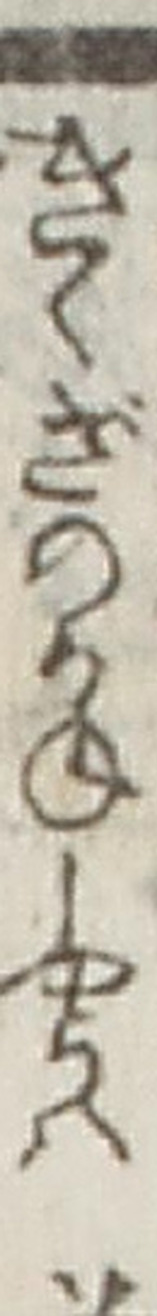きくざのかねしやうは
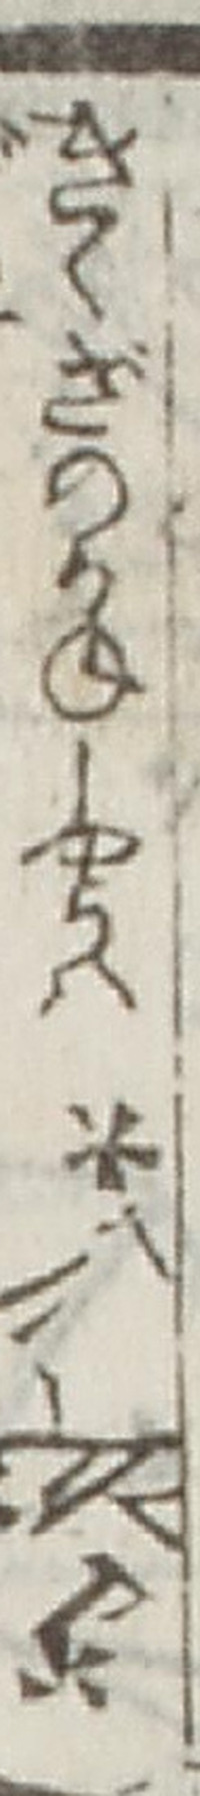きくざのかねしやうは
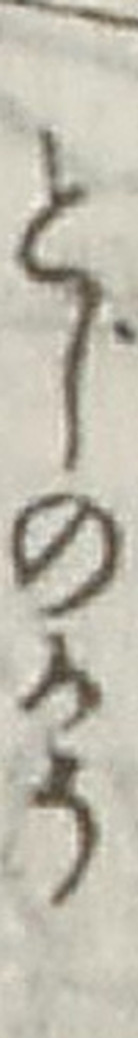としのかう
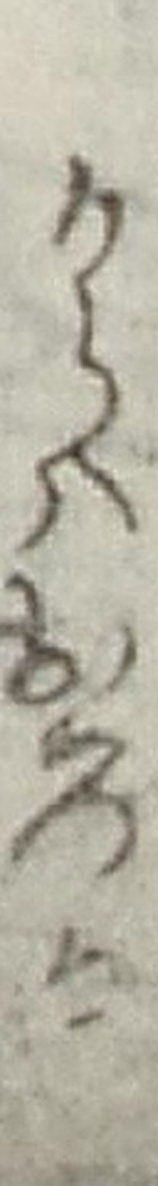からはおろか
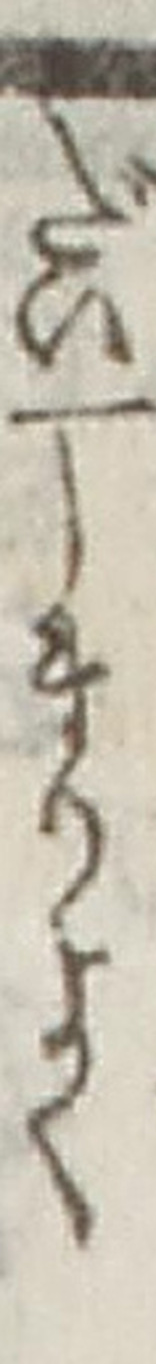だい一しまりよく
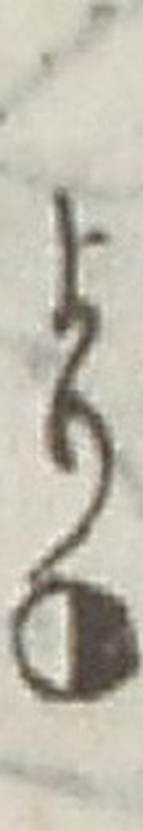より◑
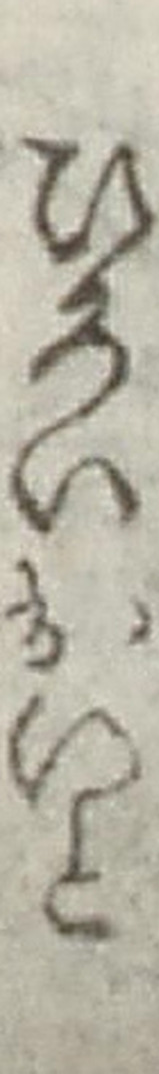ひろいおいと
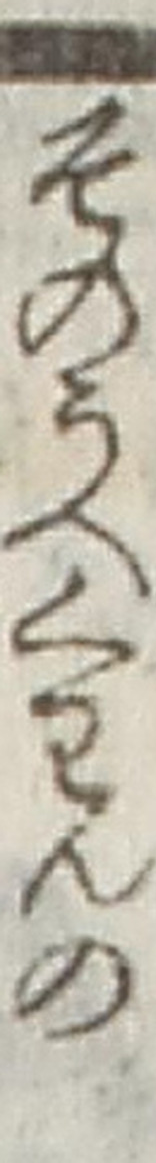そのうへくわんの
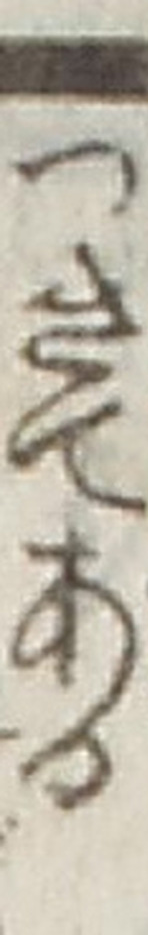つきてある
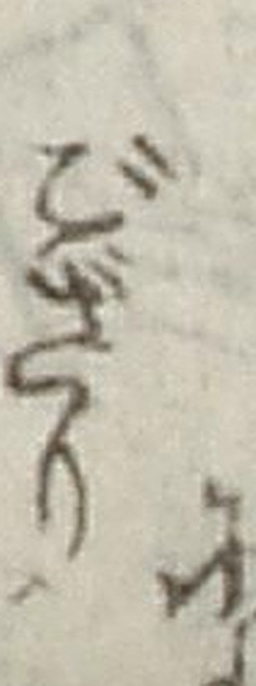ござり
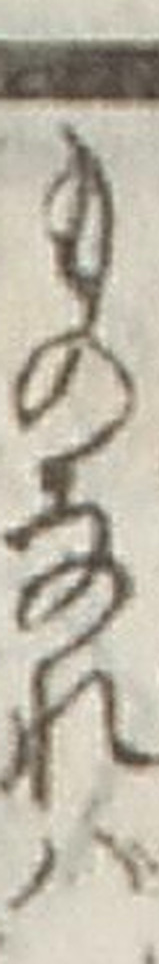ものなれば
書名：三世相出雲當座帳　上下冊
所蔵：東京大学地震研究所図書室 Earthquake Research Institute Library, The University of Tokyo, JAPAN
